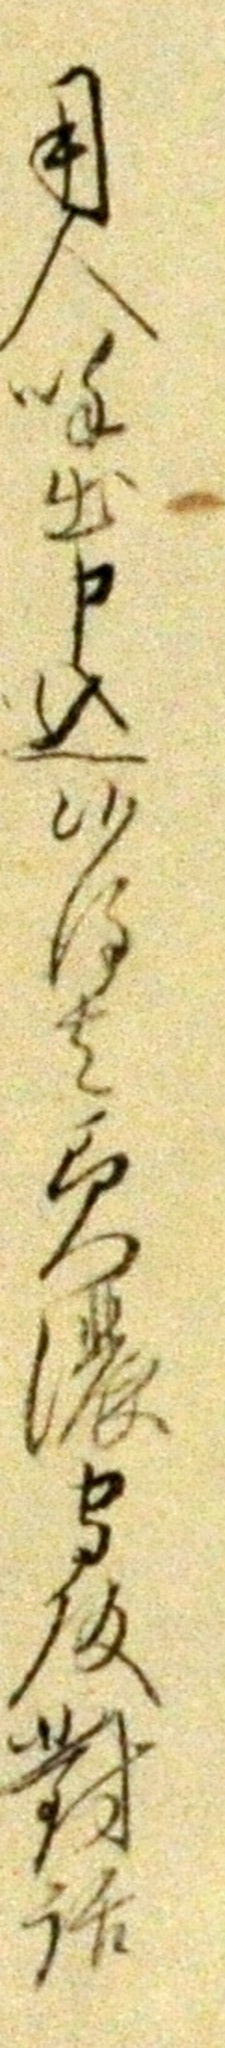用人呼出申込候得は美濃守殿対話
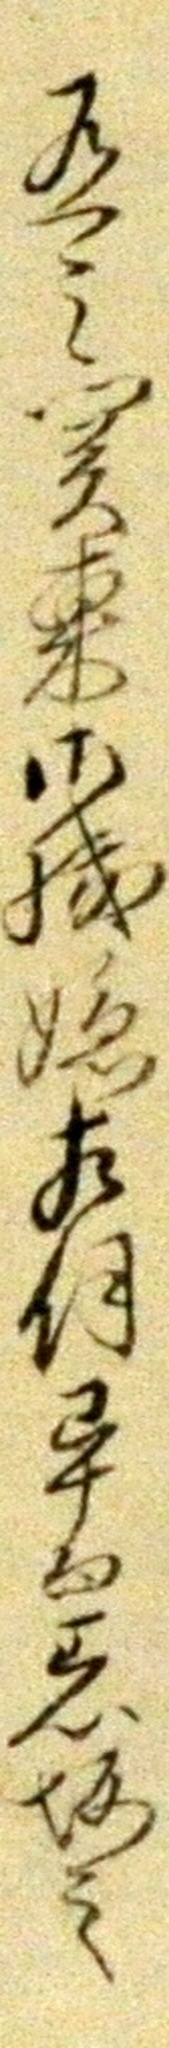有之関東御機嫌相伺畢而着坂之
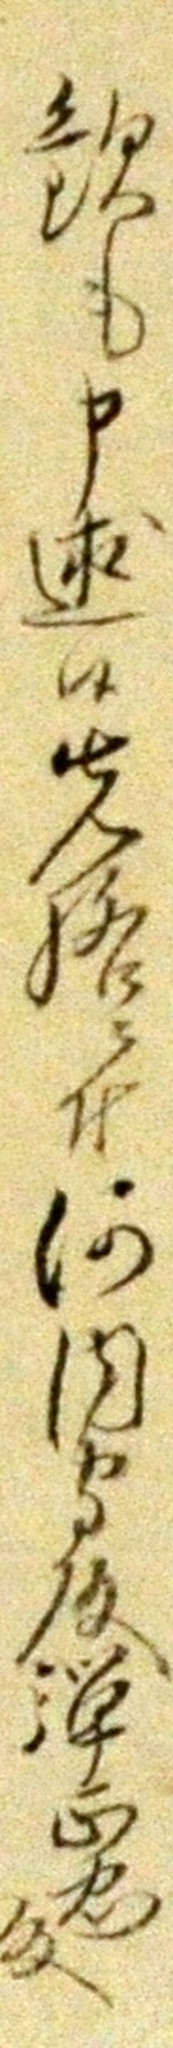歎も申述候先格ニ付河内守殿弾正忠殿
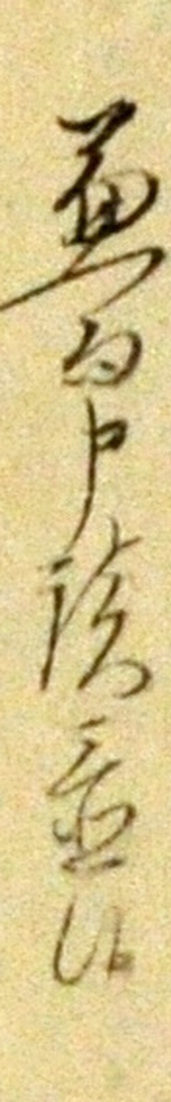兼而申談置候
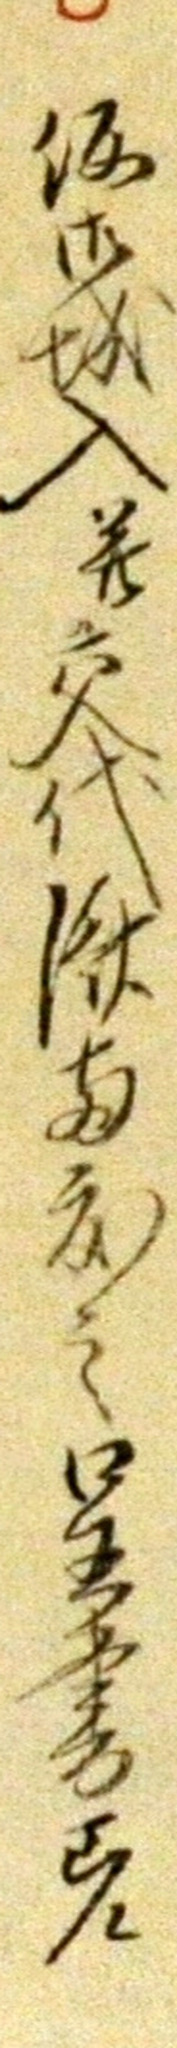仮御城入并交代済両度之呈書差
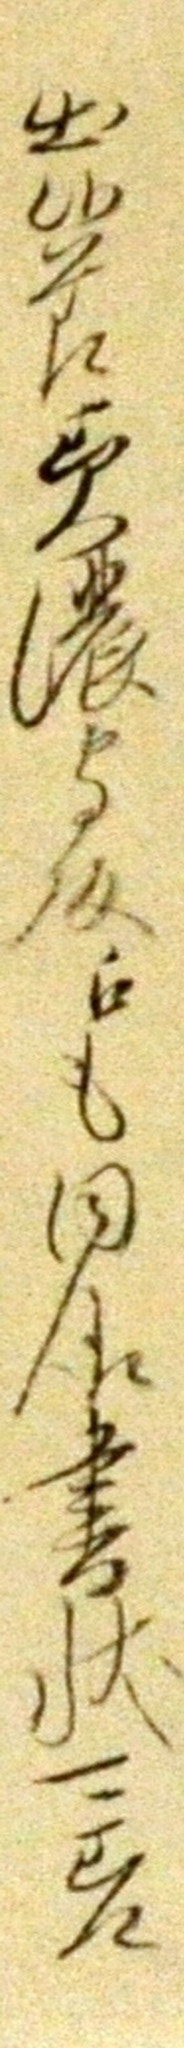出候節美濃守殿えも同様書状可差
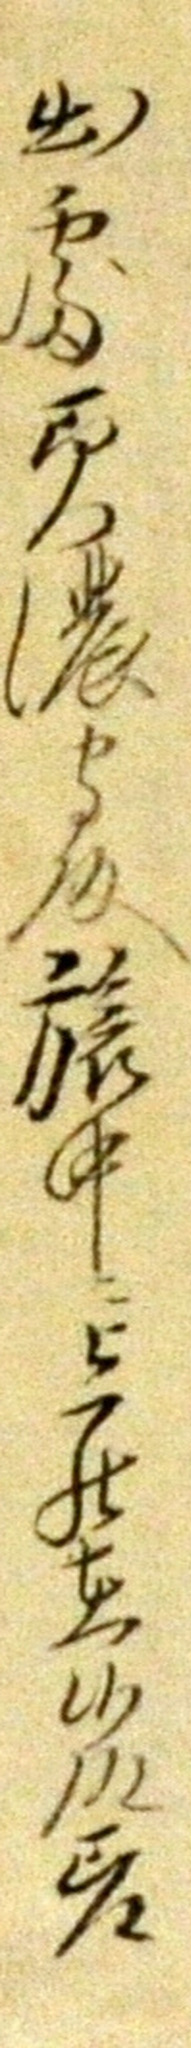出處美濃守殿旅中ニ被罷在候故差
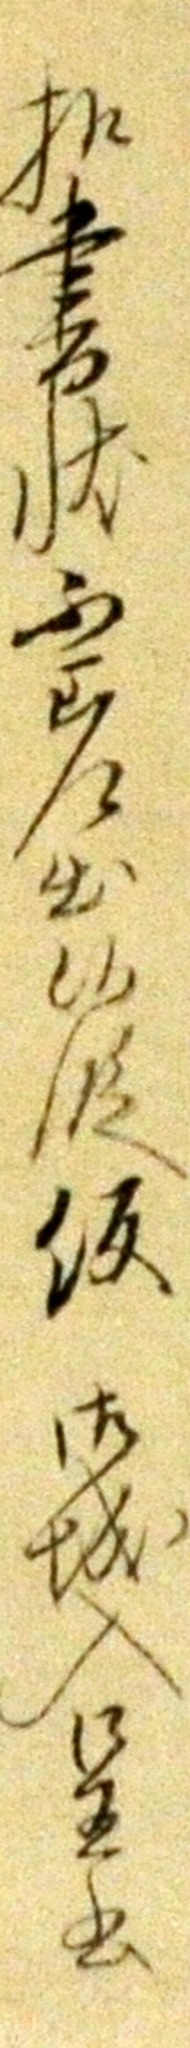控書状不差出候段仮御城入呈書
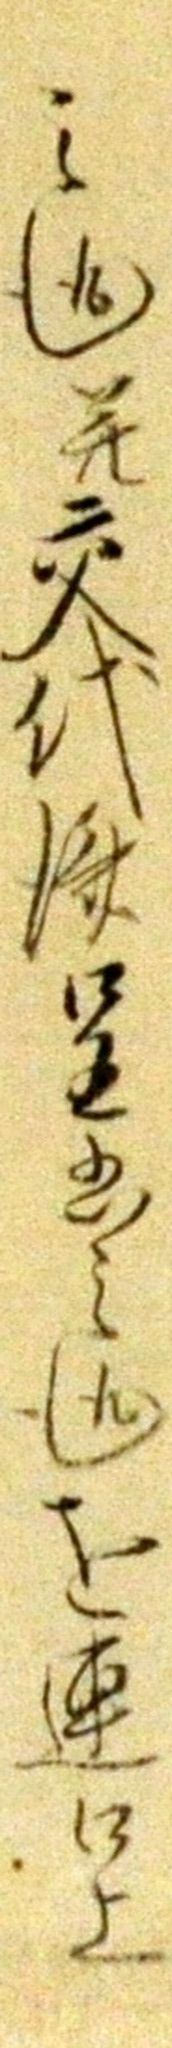之趣并交代済呈書之趣を連口上
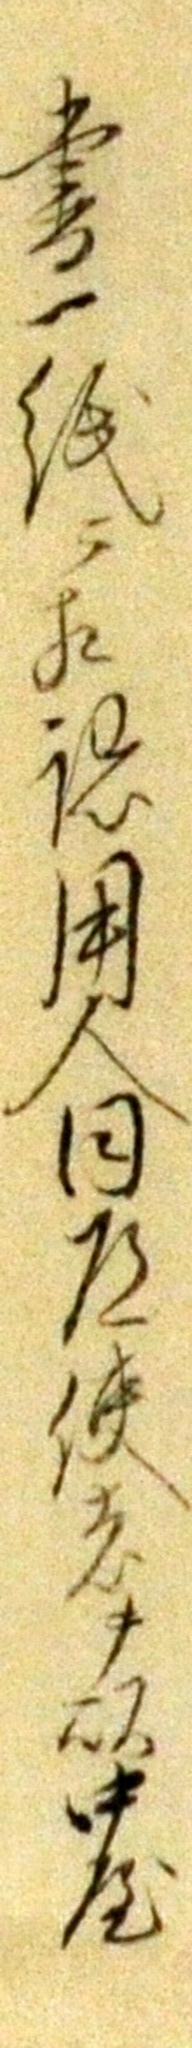書一紙ニ相認用人同道使者ヲ以中屋
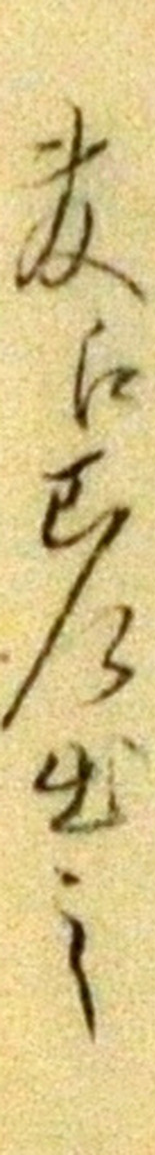敷え差出之
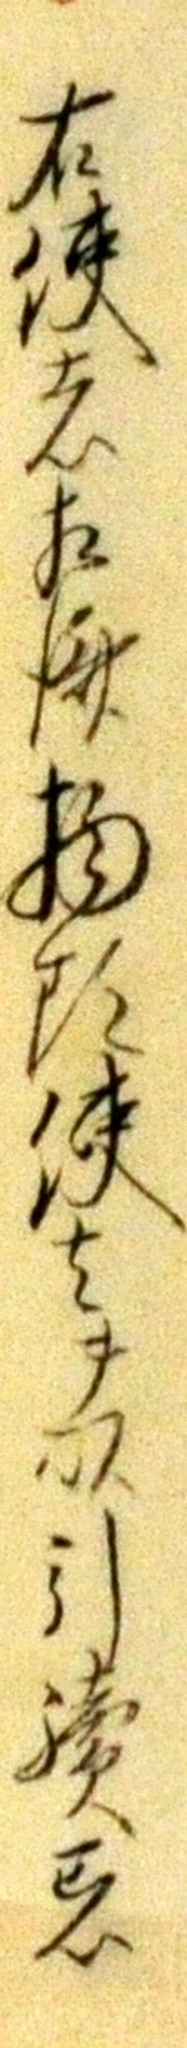右使者相済物頭使者ヲ以引続着
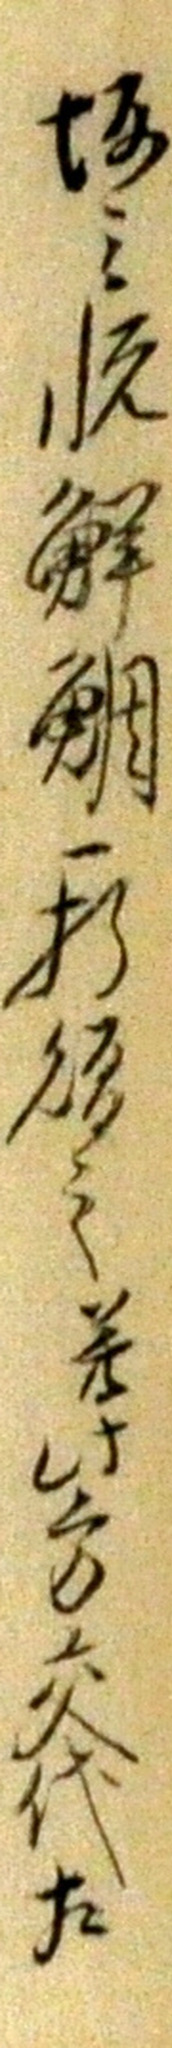坂之悦鮮鯛一折贈之并此方交代相
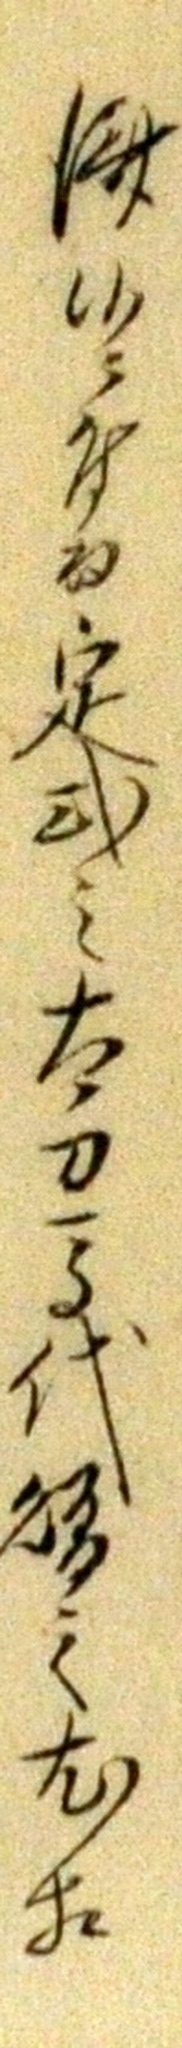済候二付而定式之太刀馬代贈之尤相
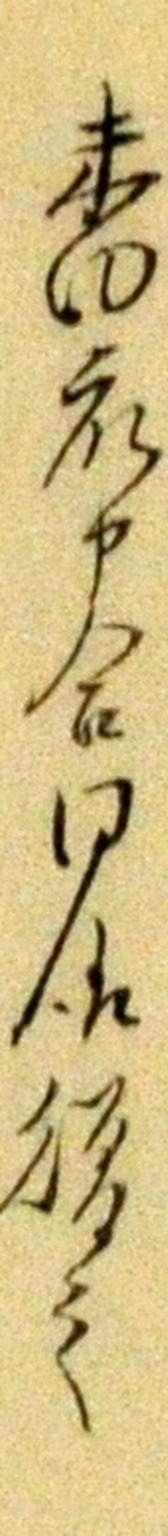番衆申合同様贈之
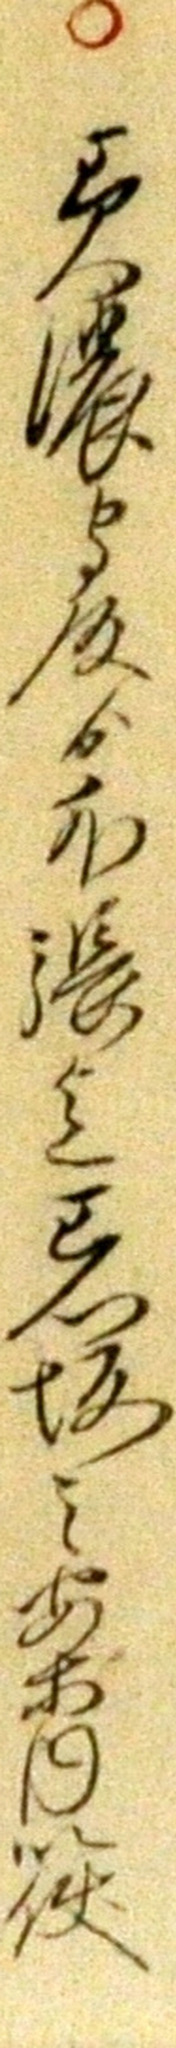美濃守殿ゟ外張迄着坂之案内以使
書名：大阪加番関係諸書留〔一括〕
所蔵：伊那市立高遠町図書館・合同会社AMANE
